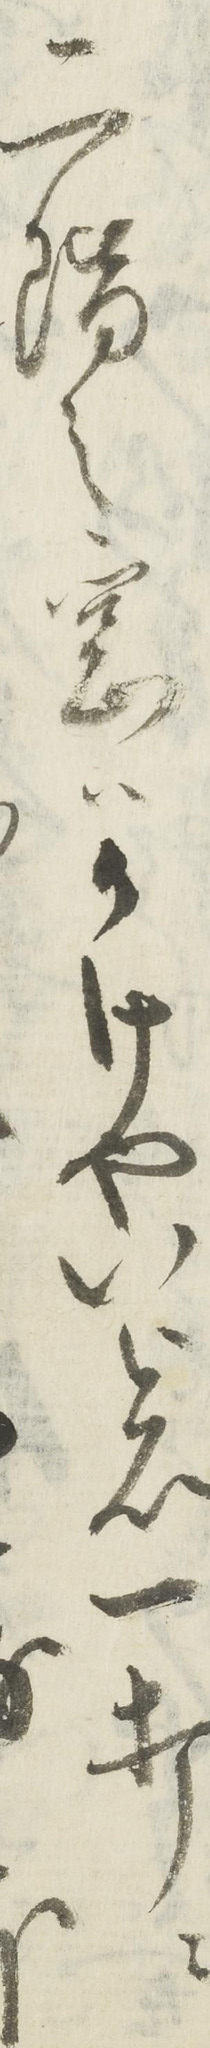二階之窓はかけやいを以一打ニ
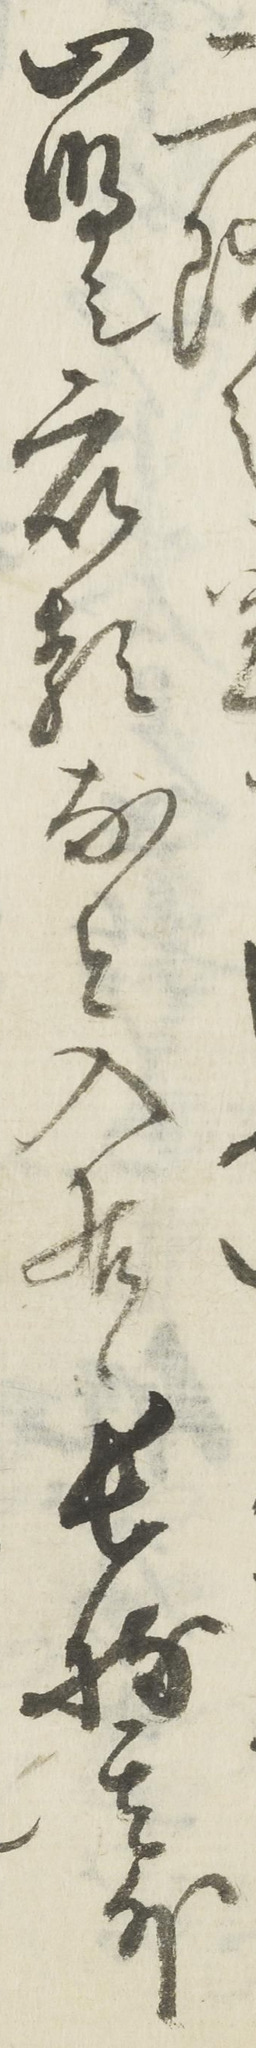崩シ衣類なと入居候長持其外
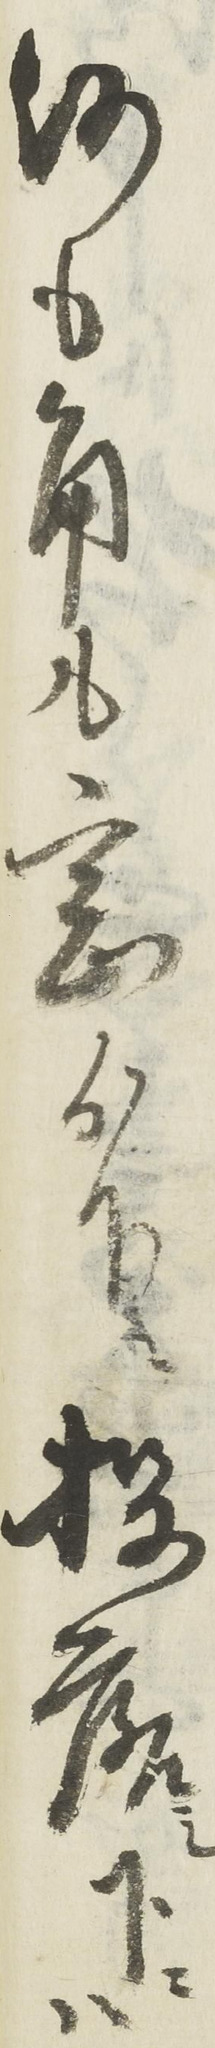何も角も窓ゟ下に投落シ下ニは
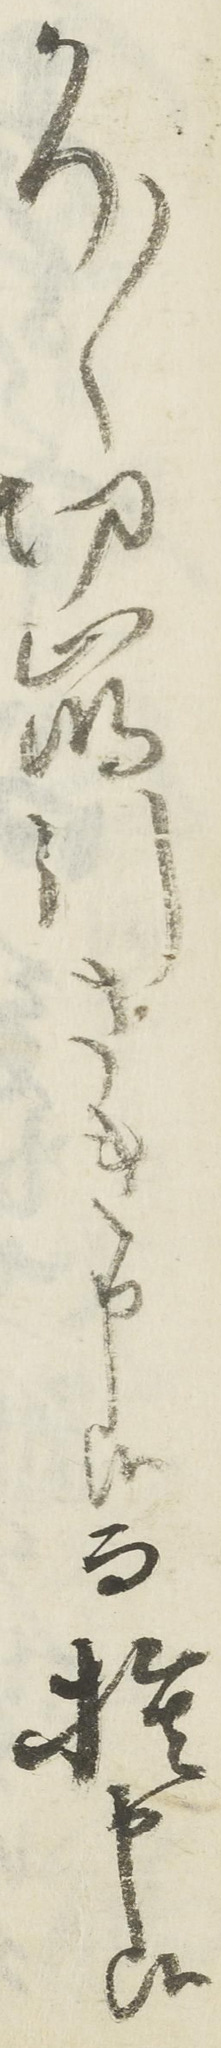かつ〳〵切崩引さき申候而捨申候
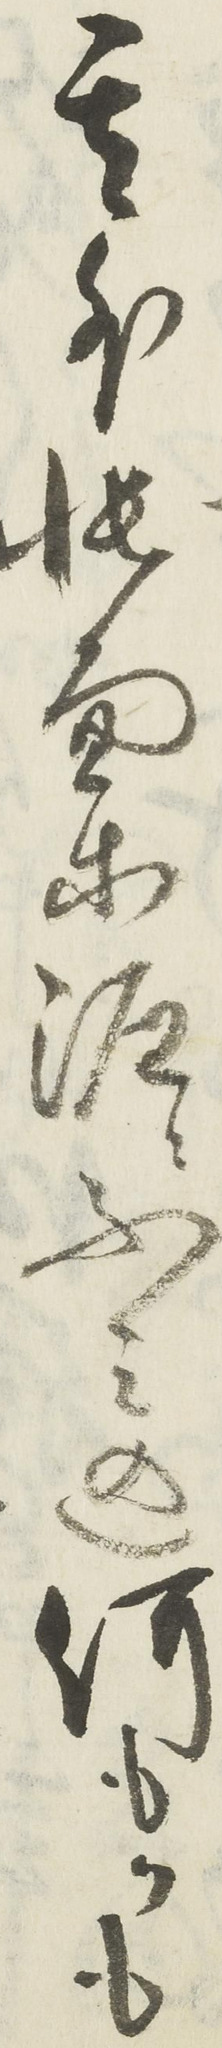其外帳面等泥ニふみ込何もケも
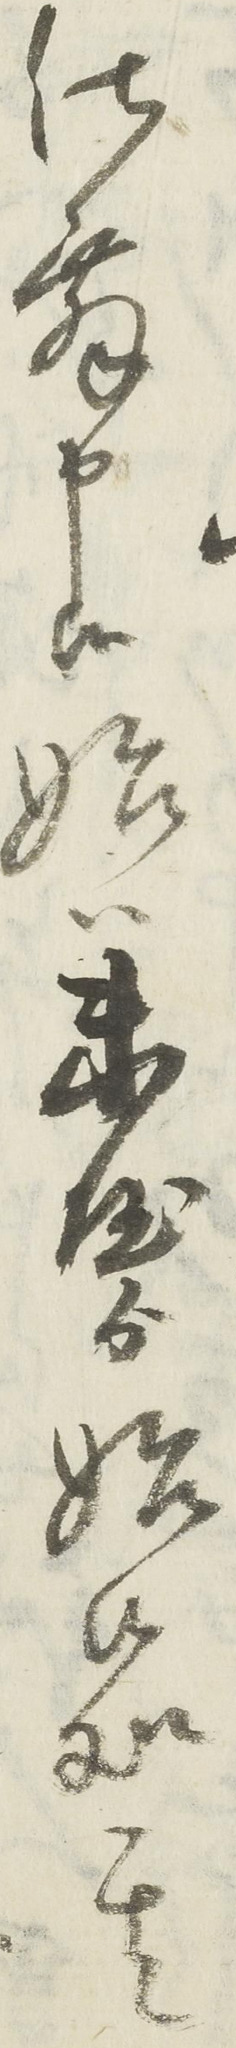仕舞申候始は米屋ゟ始候処其
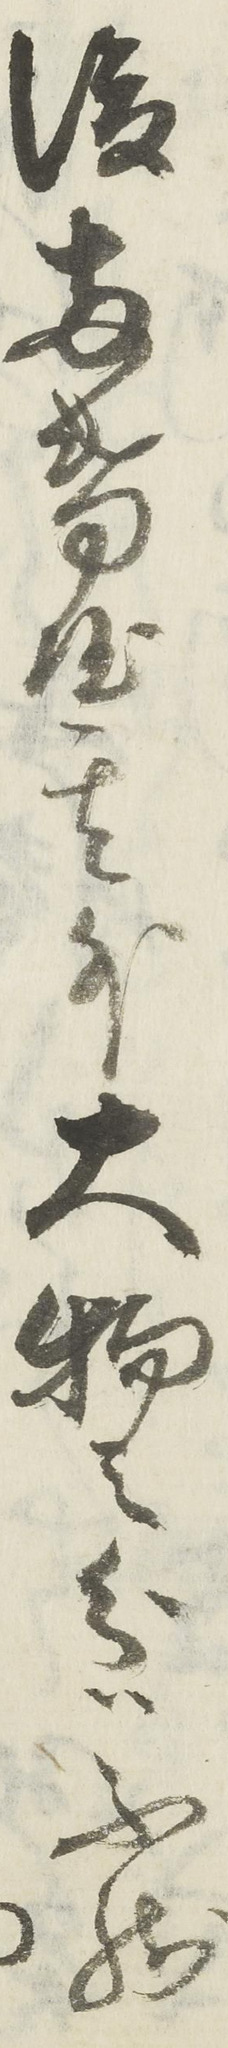後両替屋其外大物之分は不残
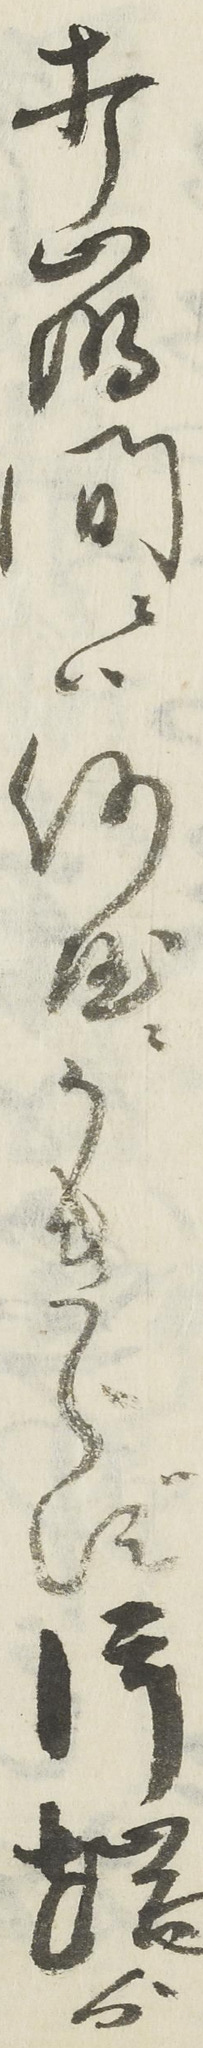打崩間には何屋二かきらず片端ゟ
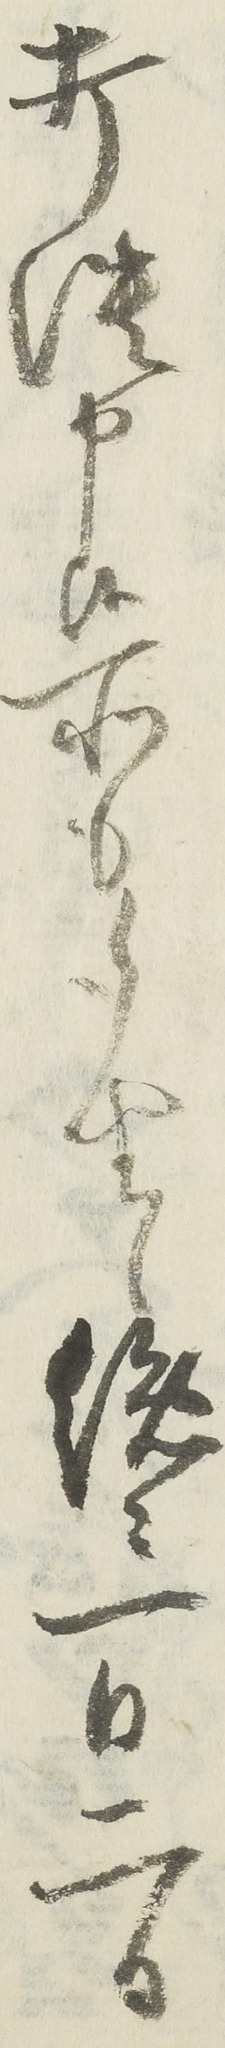打潰申候所も御坐候纔ニ一日二日
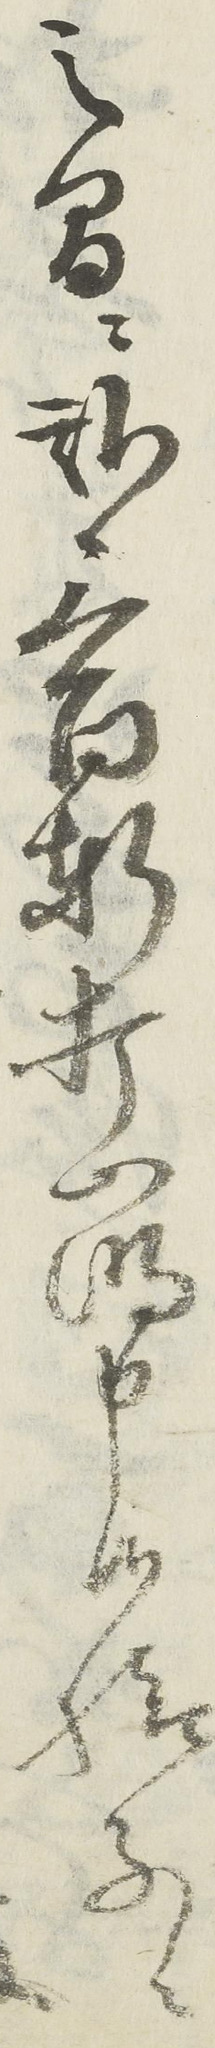之間ニ弐三百軒打崩申候様子ニ
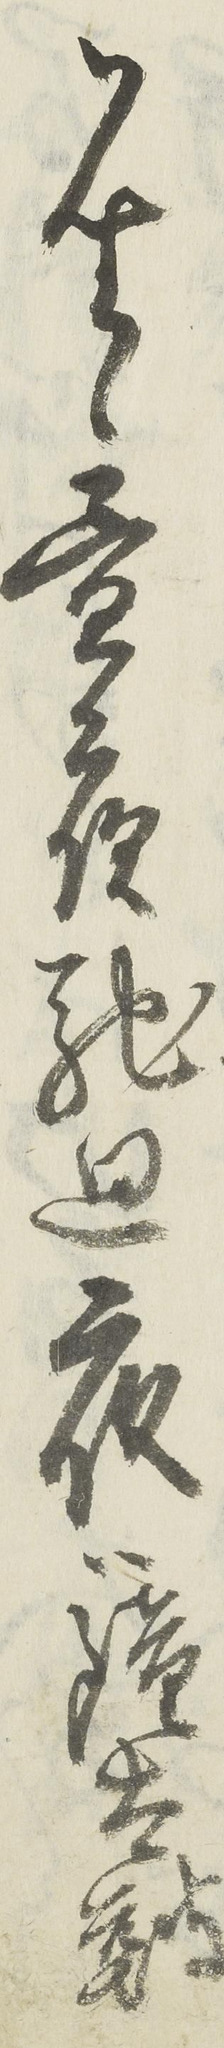御坐候昼夜馳廻夜は鐘太鼓
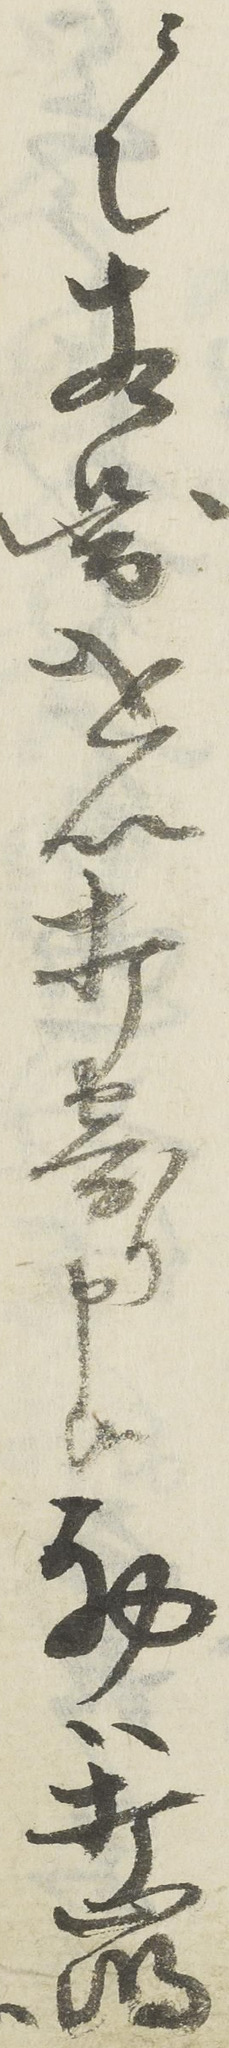ニて相図を以打寄り申候初は打崩候

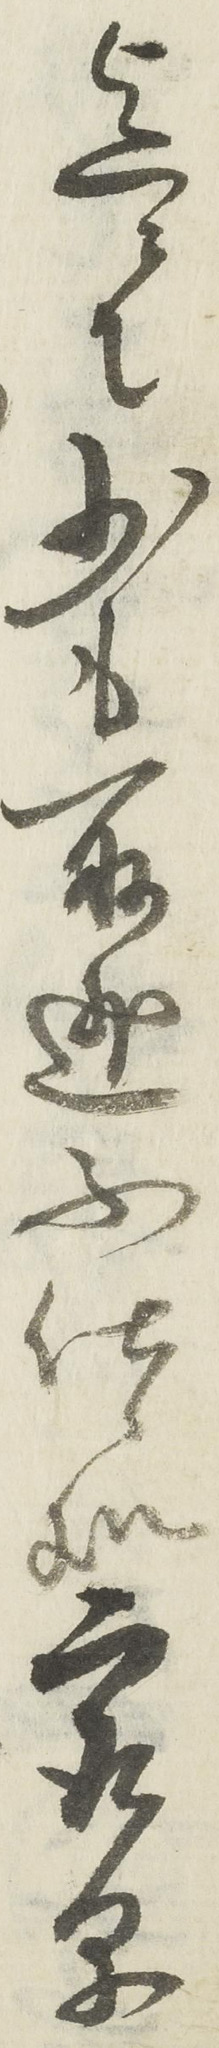迄ニて少も取逃不仕候処最早
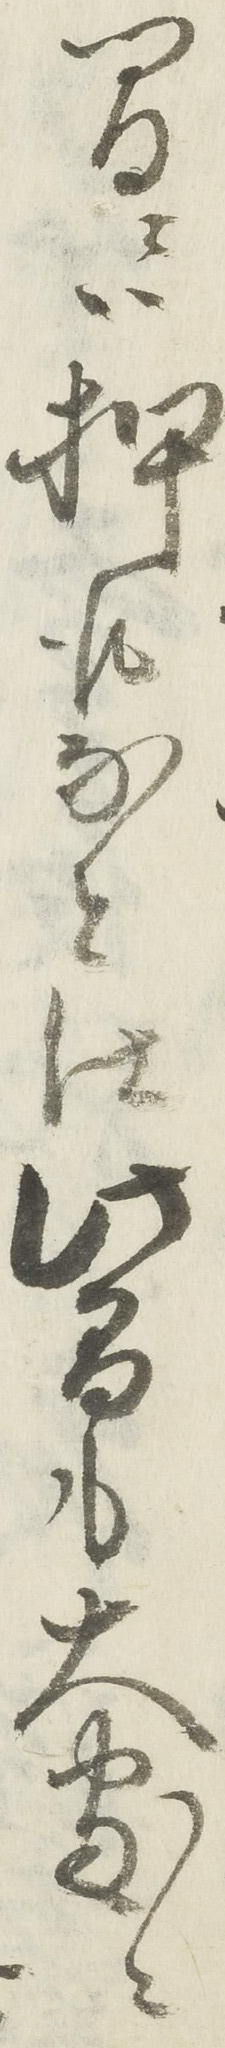間ニは押取なと仕此間も大家ニ
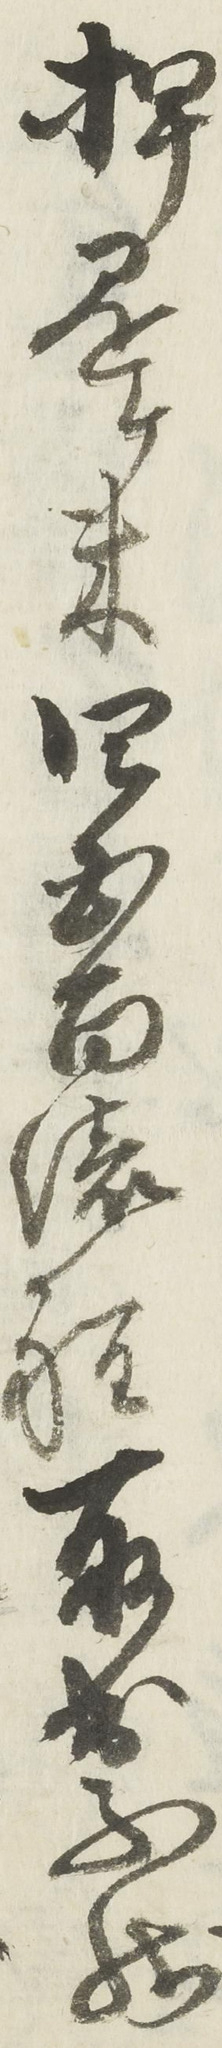押懸ケ米四五百俵程取出不残
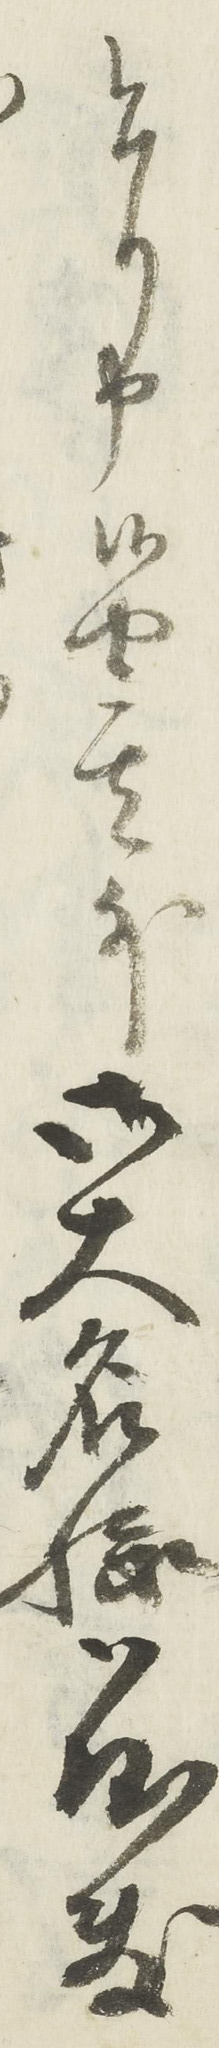とり申候由其外御大名様御屋敷
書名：後見笑
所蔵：東京大学地震研究所図書室 Earthquake Research Institute Library, The University of Tokyo, JAPAN
